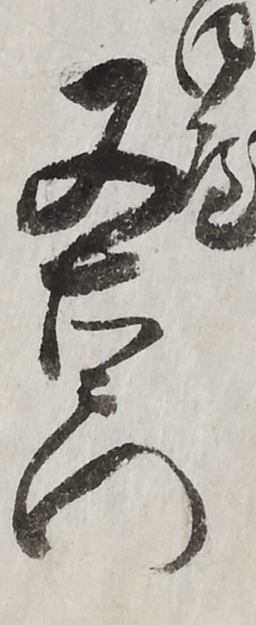又右衛門

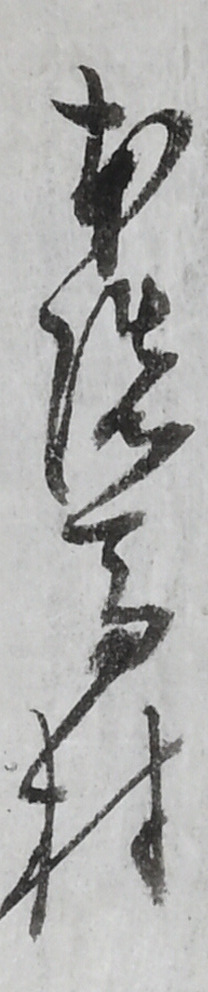本洗馬村
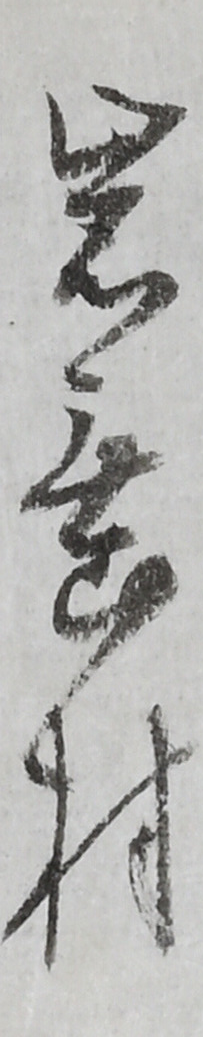岩垂村
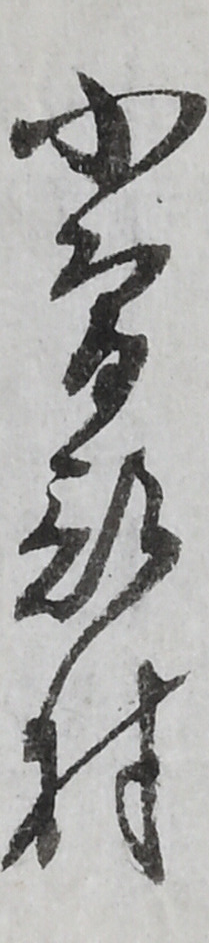小曽部村
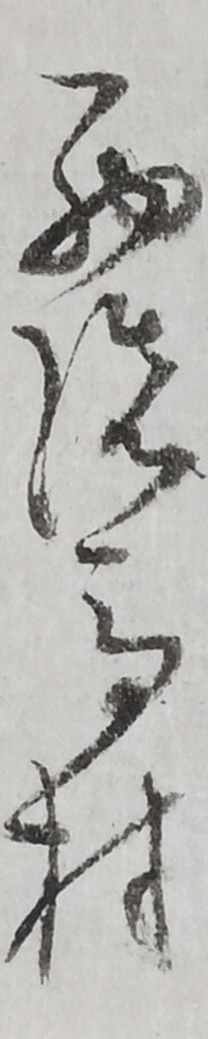西洗馬村
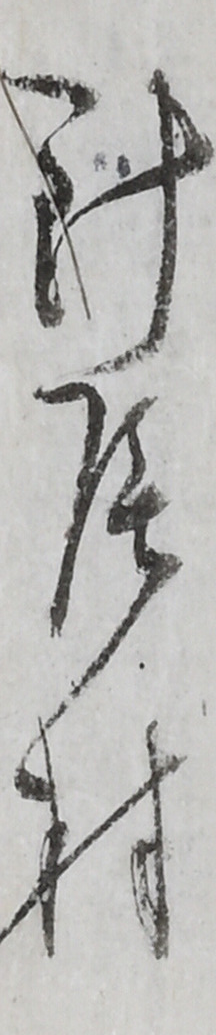針屋村
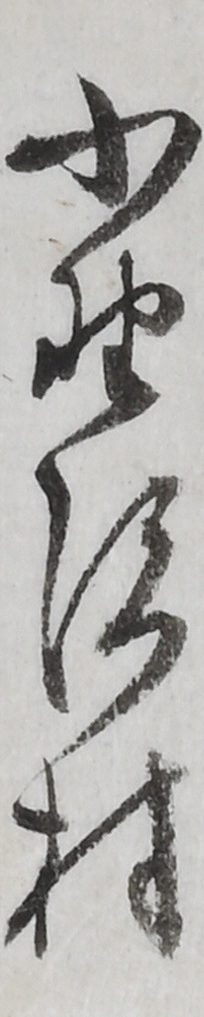小野沢村
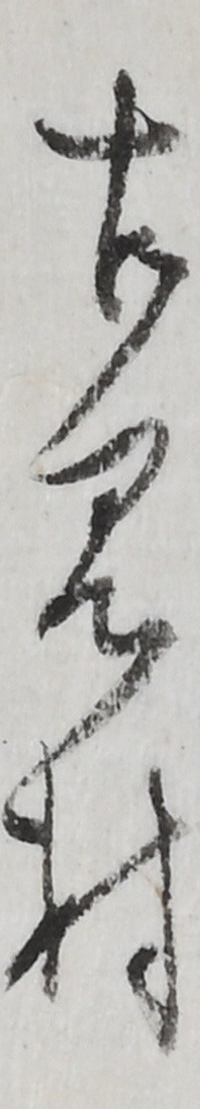古見村
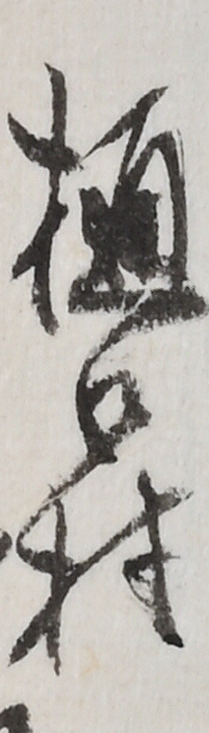樋口村
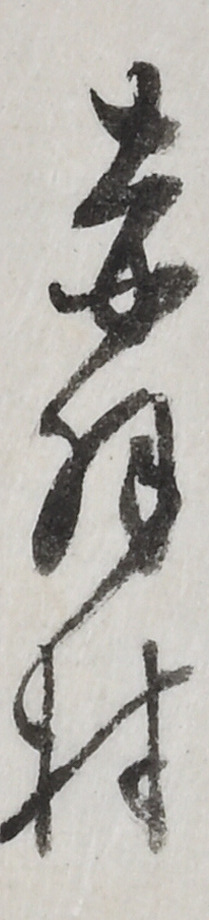赤羽村
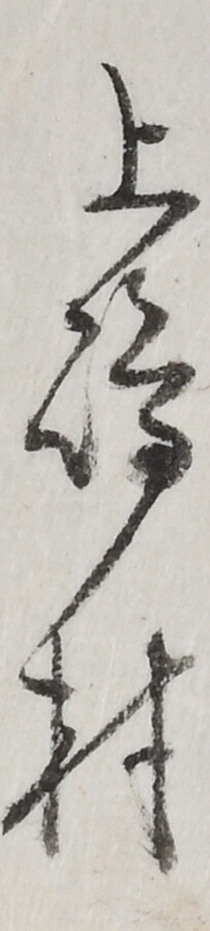上嶋村
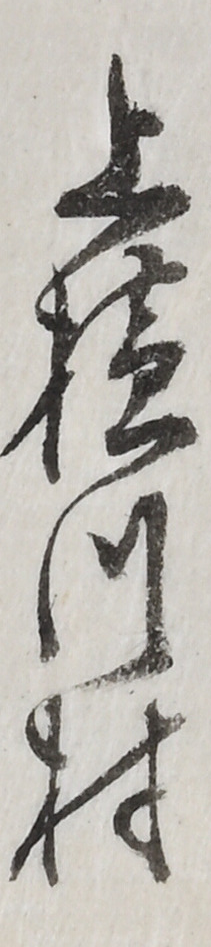上横川村
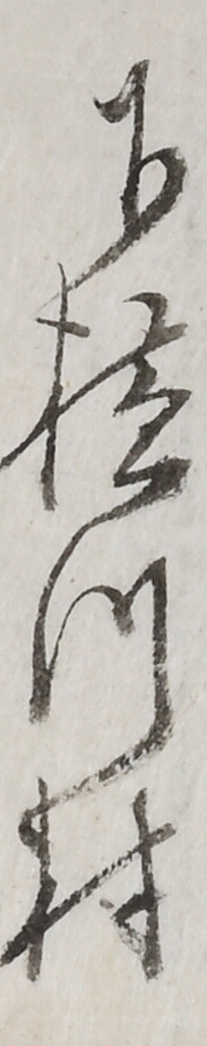下横川村
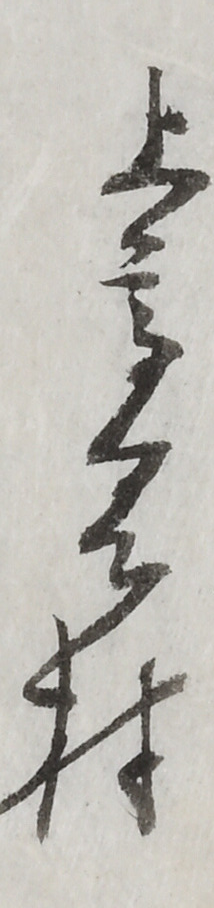上高見村
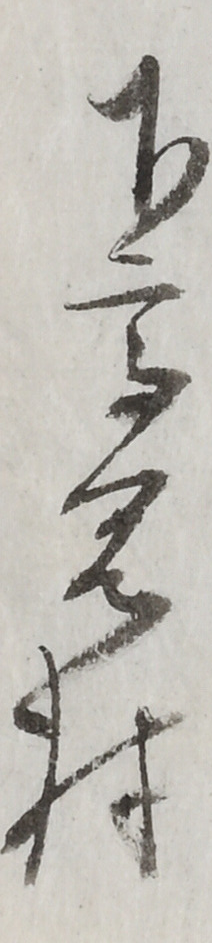下高見村

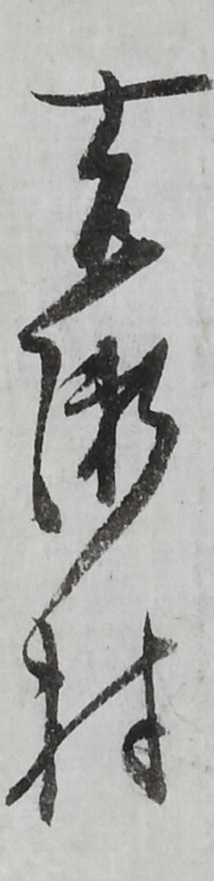吉瀬村
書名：年内行事帳
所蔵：伊那市立高遠町図書館・合同会社AMANE
